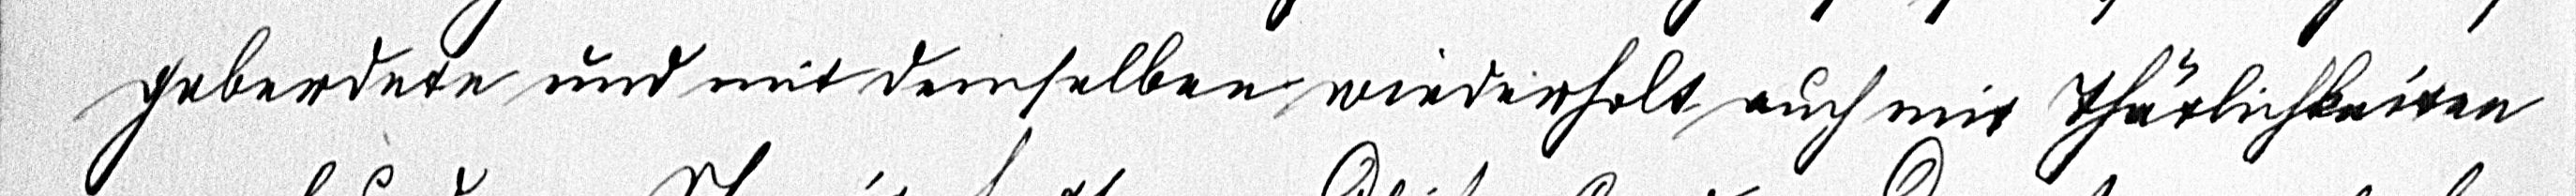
geberdete und mit demselben wiederholt auch mit Thätlichkeiten
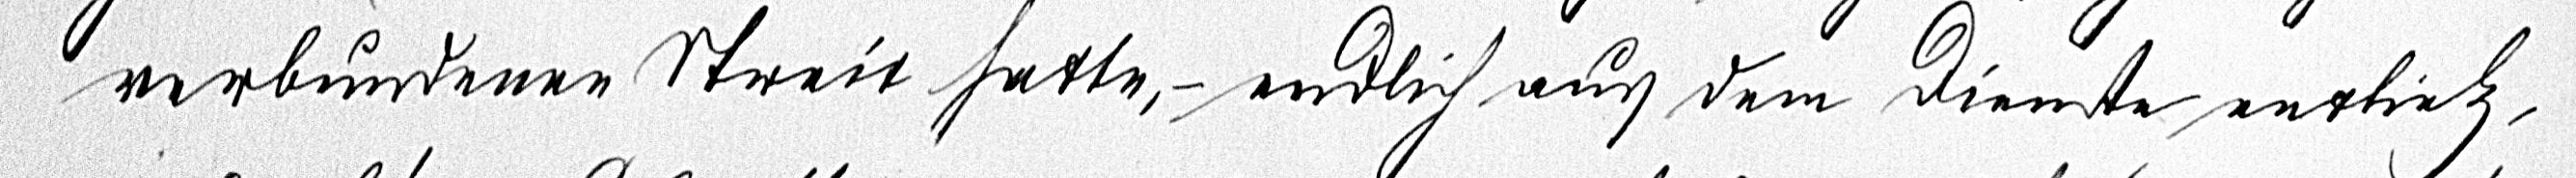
verbundenen Streit hatte,- endlich aus dem Dienste entließ,
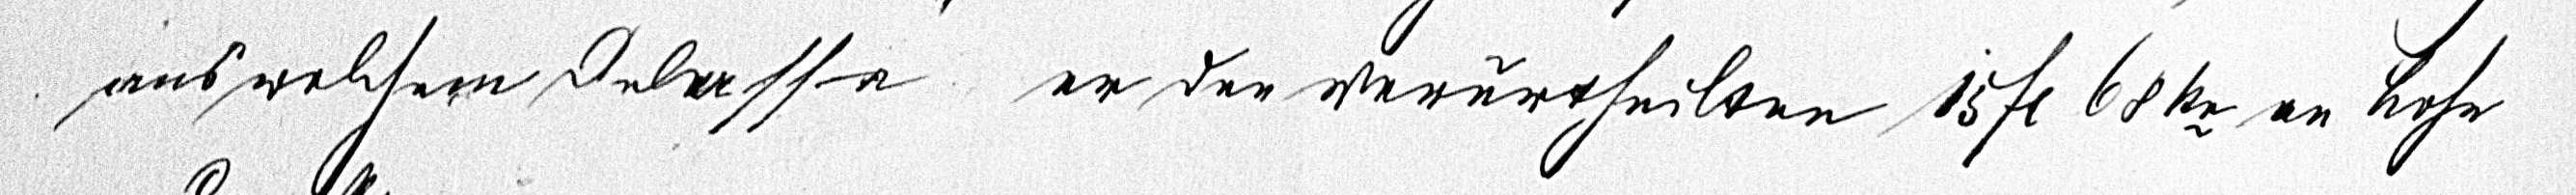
ans welchem xx er der verurtheilten 15fl 68 kr an Lohe
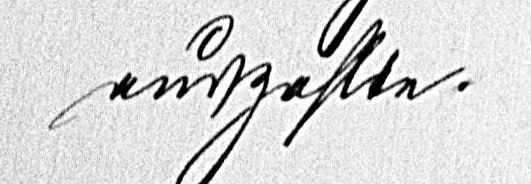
auszahlte.
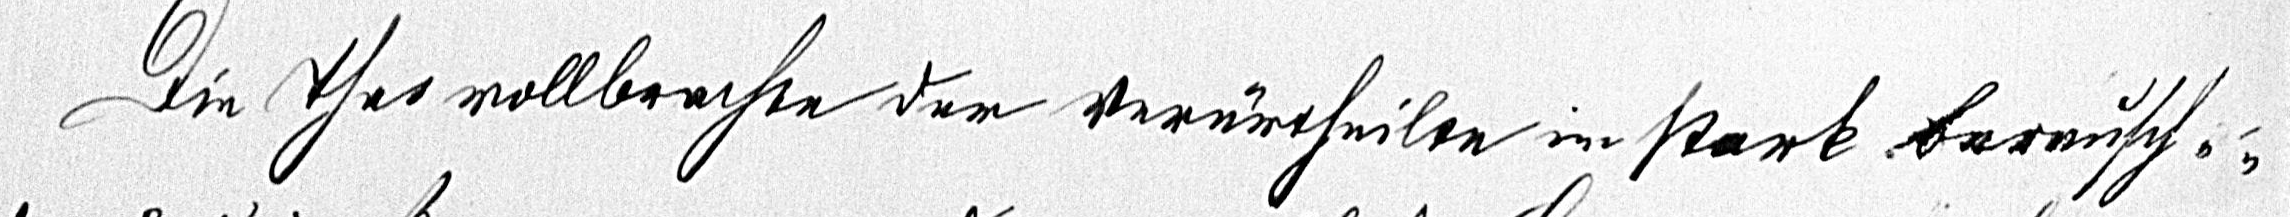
Die That vollbrachte der verurtheilte im stark Berausch¬
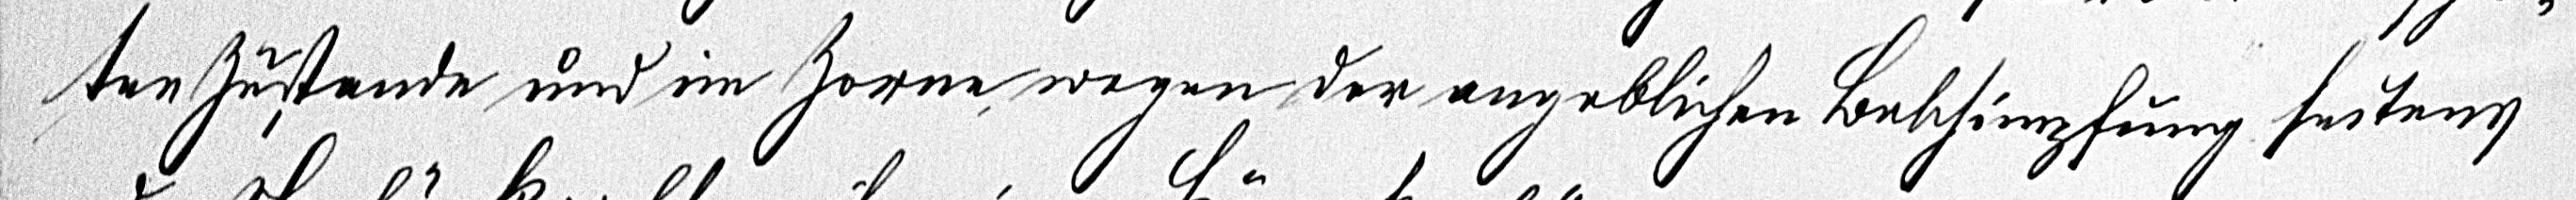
ten Zustande und im Zorne, wegen der angeblichen Beschimpfung seitens
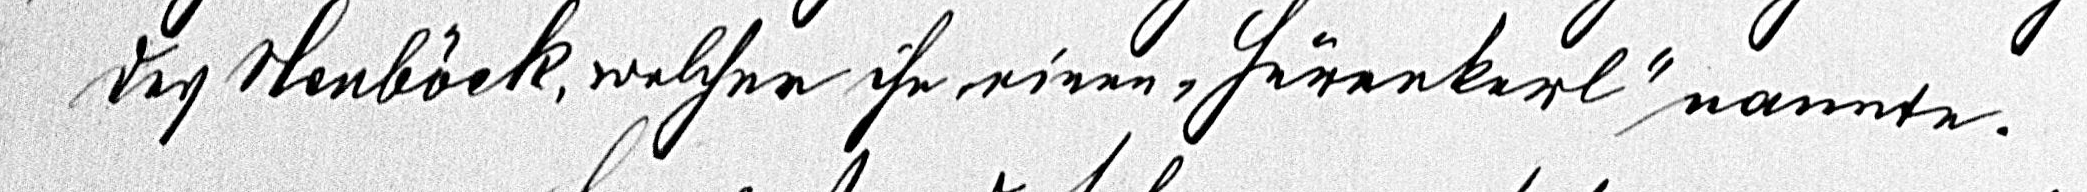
des Neuböck, welcher ihn einen „Heuenkerl“ nannte.
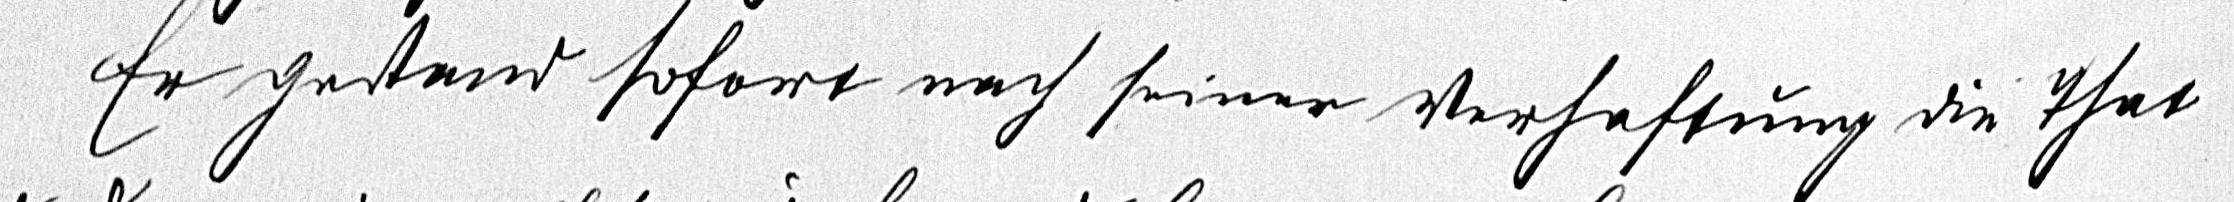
Er gestand sofort nach seiner Verhaftung die That
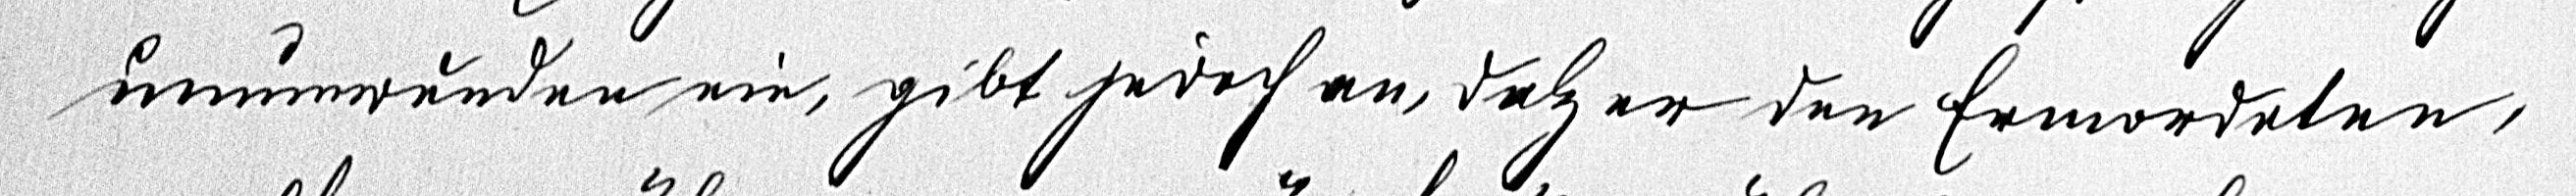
xxunden ein, gibt jedoch an, daß er den Ermordeten,
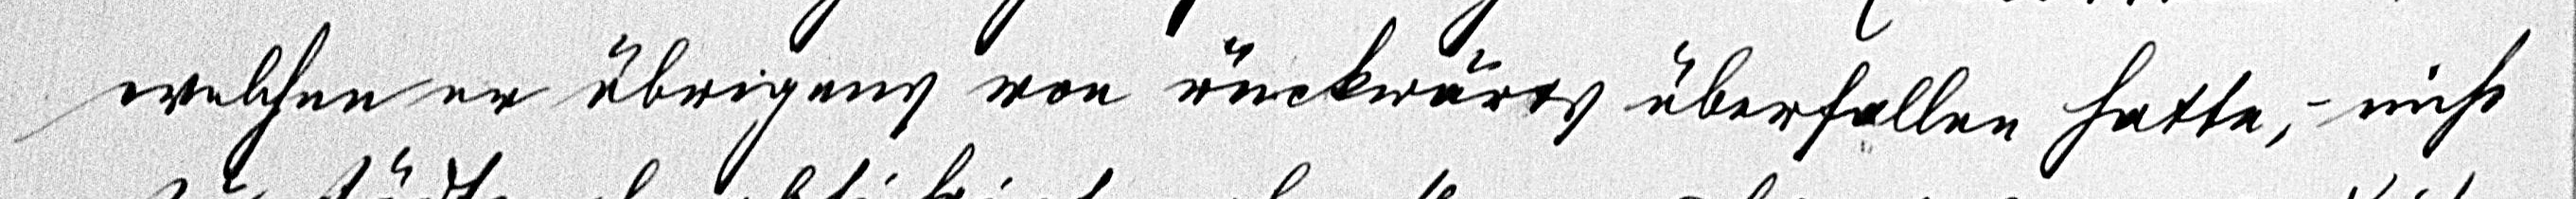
welchen er übrigens von rückwärts überfallen hatte,- nicht
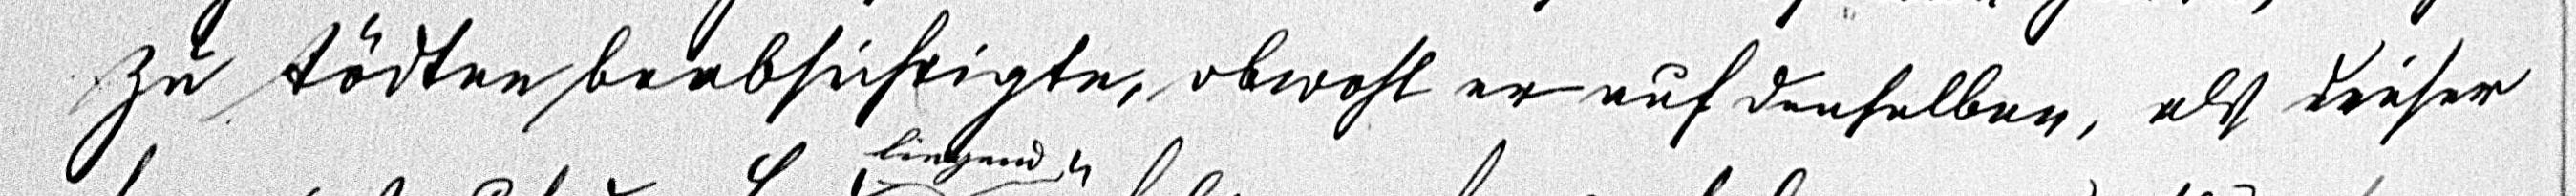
zu tödten beabsichtigte, obwohl er auf denselben, als dieser
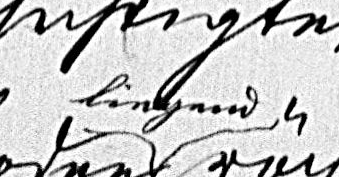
liegend
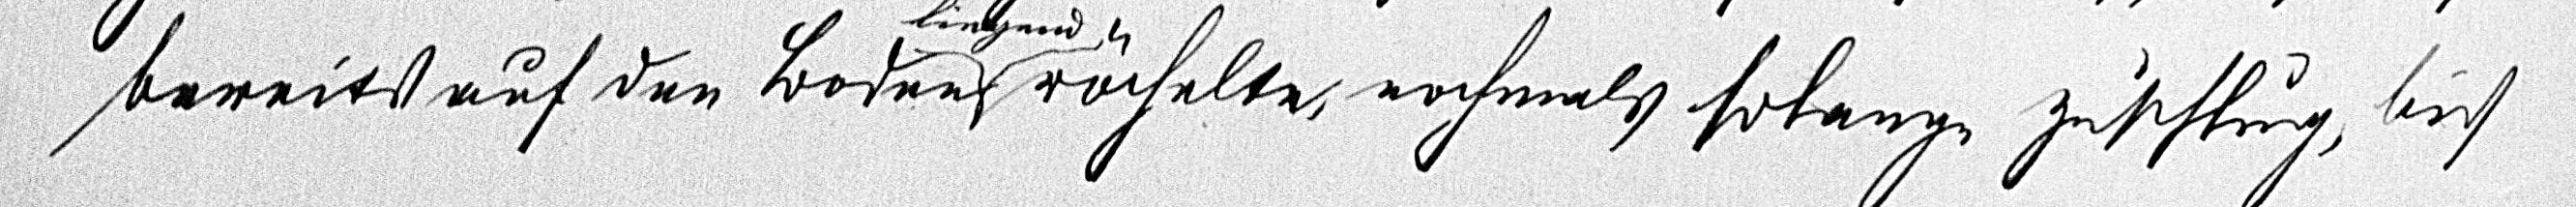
bereits auf den Boden röchelte, nochmals solange zuschlug, ließ
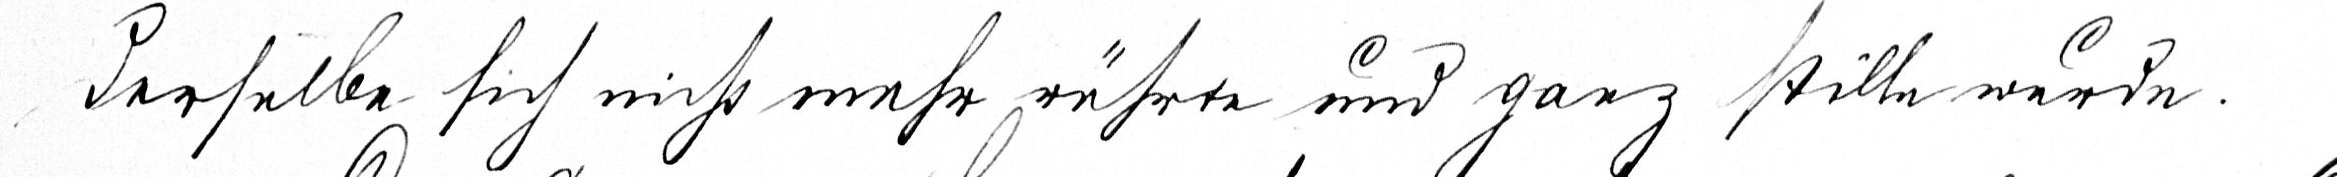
derselbe sich nicht mehr rührte und ganz stille wurde.
